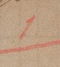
1870.
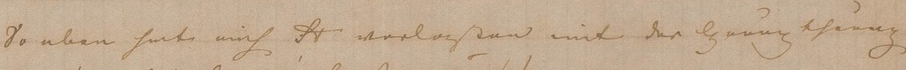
So eben hat mich St verlaßen mit der Genugthuung
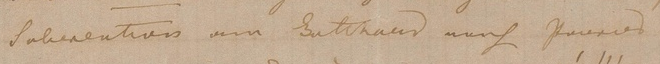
Subvention am Gotthard nach Paris –
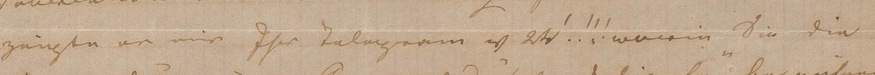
zeigte er mir Ihr Telegram vom 24t!!! worin Sie die
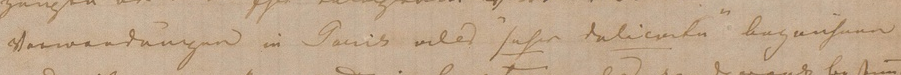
Verwendungen in Paris als «sehr delicate» bezeichnen
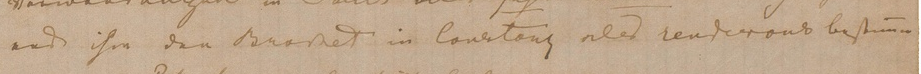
und ihm den Brochet in Constanz als rendevous bestimmen
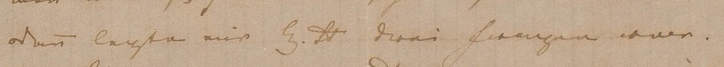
Dann legte mir H. St drei Fragen vor.
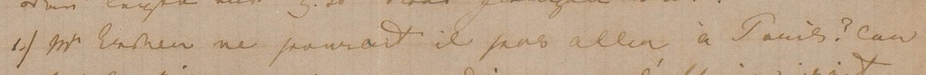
1.) Mr Escher ne pouvait il pas aller à Paris? Car
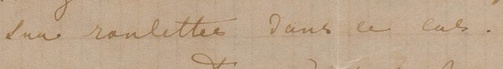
sur roulettes dans ce cas.
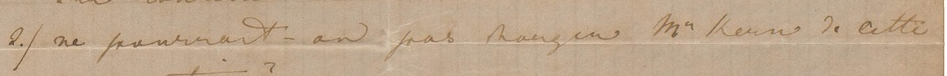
2.) ne pourrait-on pas changer MrKern de cette
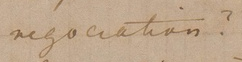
negociation?
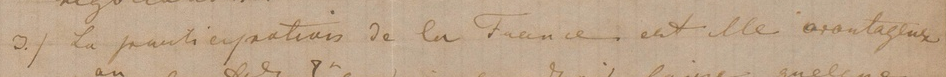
3.) La participation de la France est elle avantageuse
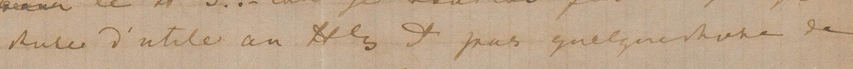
chose d'utile au St G d pas quelque chose de
